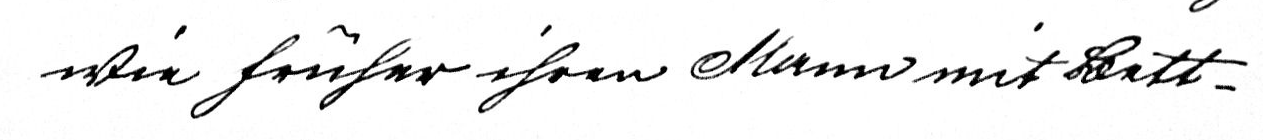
wie früher ihren Mann mit Bett¬
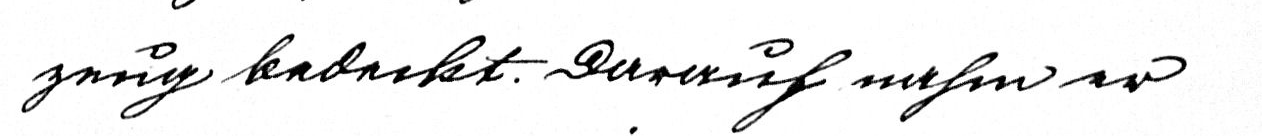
zeug bedeckt. Darauf nahm er
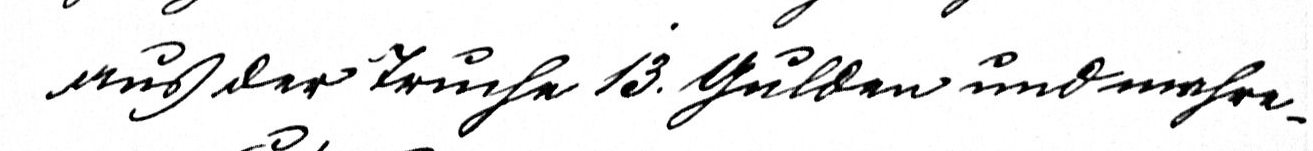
aus der Truche 13. Gulden und mehre¬
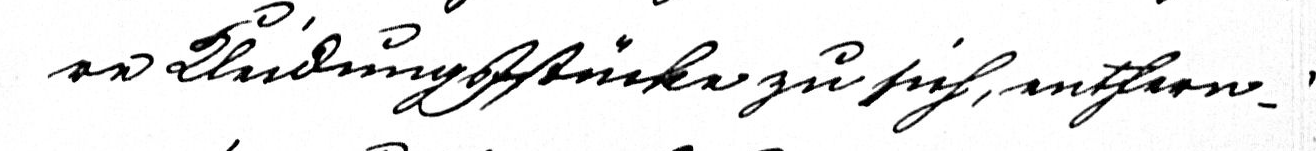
re Kleidungsstücke zu sich, entfern¬
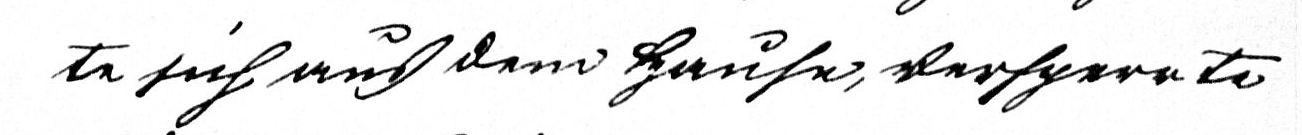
te sich aus dem Hause, versperrte
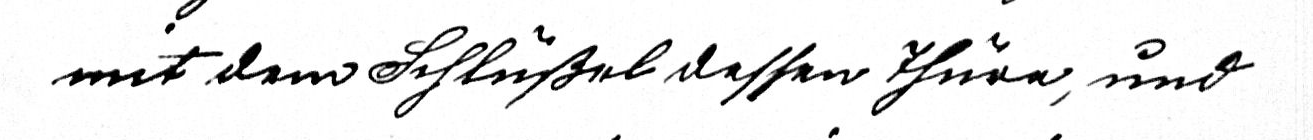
mit dem Schlüßel dessen Thüre, und
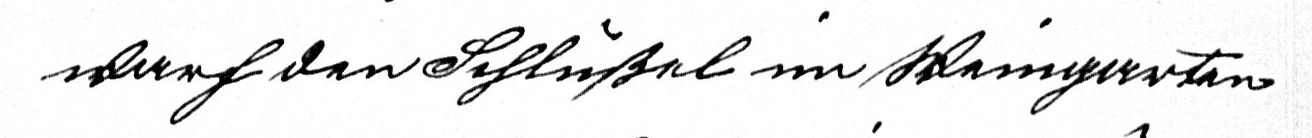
warf den Schlüßel im Weingarten
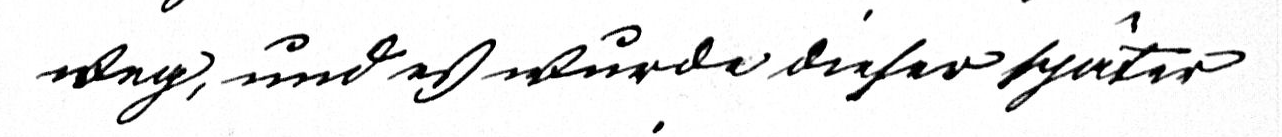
weg, und es wurde dieser später
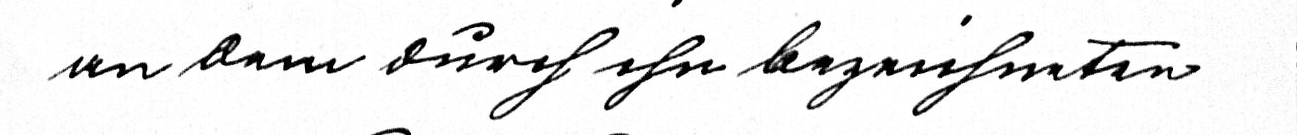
an dem durch ihn bezeichneten
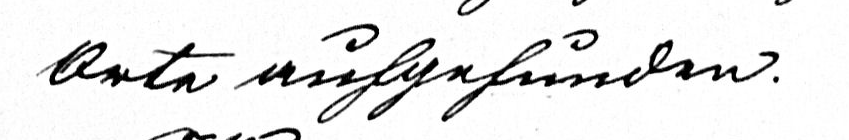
Orte aufgefunden.
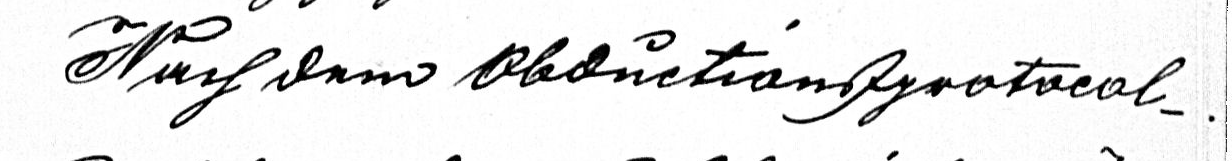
Nach dem Obductionsprotocol¬
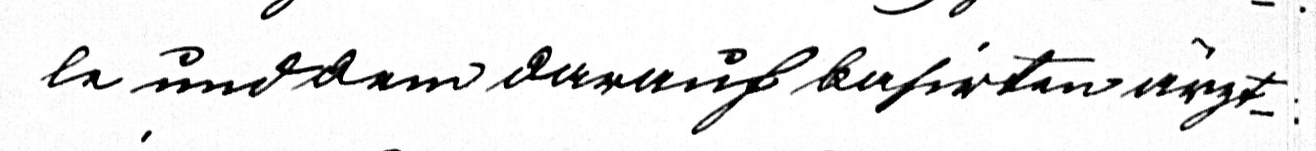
le und dem darauf kasirten ärzt¬
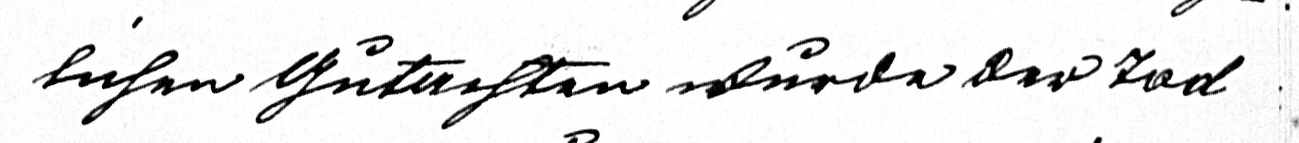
lichen Gutachten wurde der Tod
